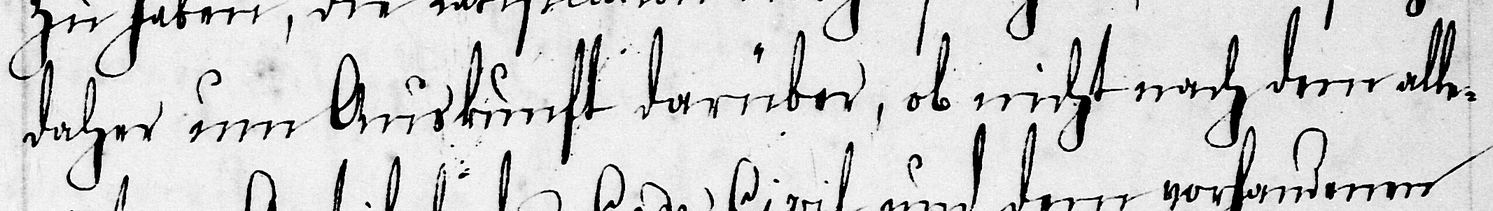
daher um Auskunft darüber, ob nicht nach dem all¬
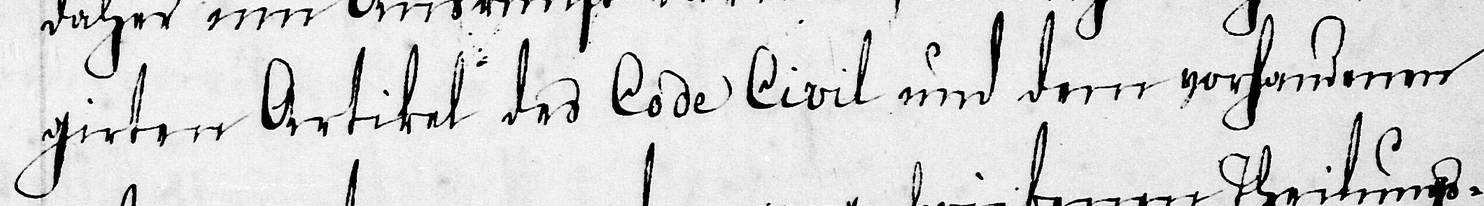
egirten Artikel des Code Civil und dem vorhandenen
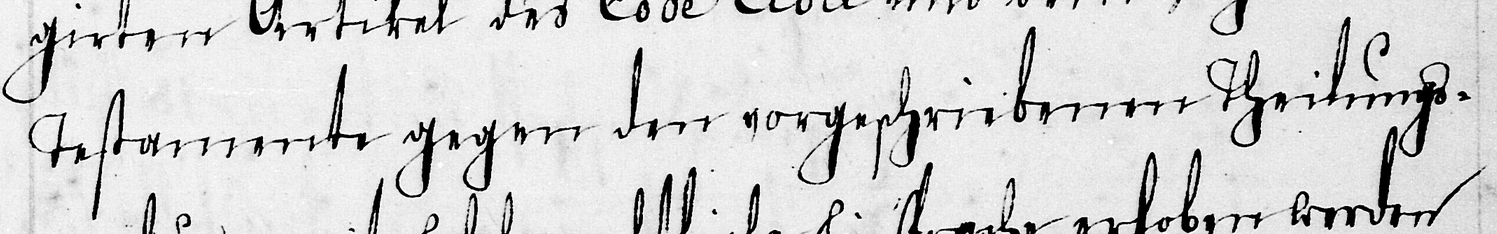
Testamente gegen den vorgeschriebenen Theilungs¬
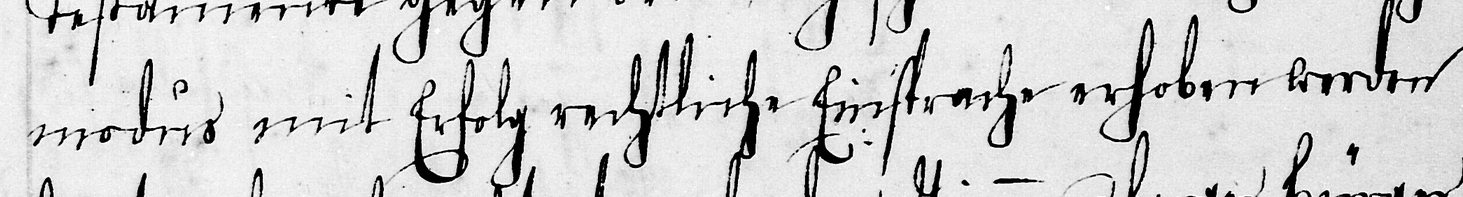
modus mit Erfolg rechtliche Einsprache erhoben werden
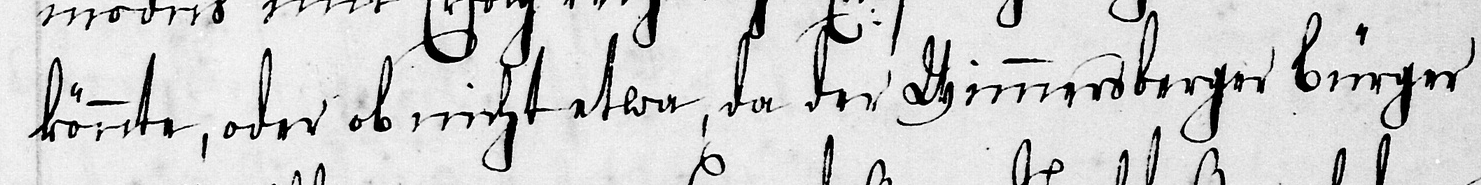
könnte, oder ob nicht etwa, da der Wimmersberger Bürger
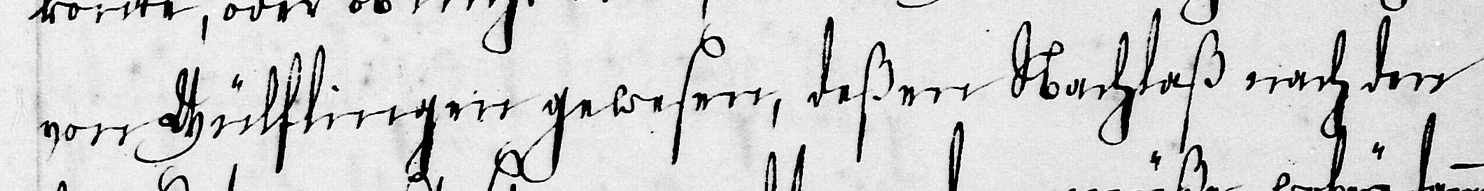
von Wülflingen gewesen, deßen Nachlaß nach den
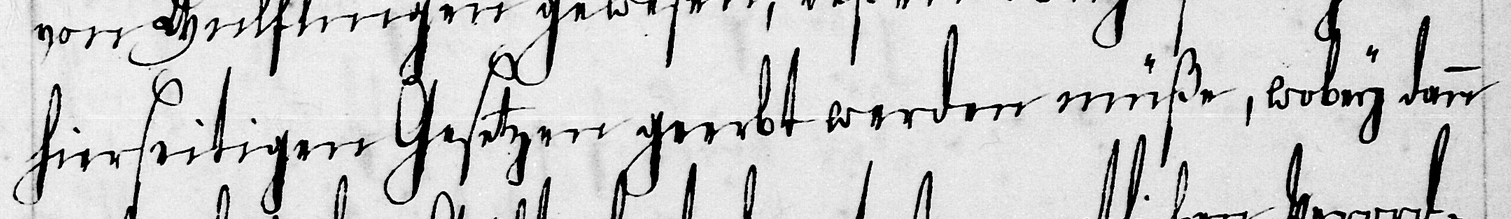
hierseitigen Gesetzen geerbt werden müße, wobey dann
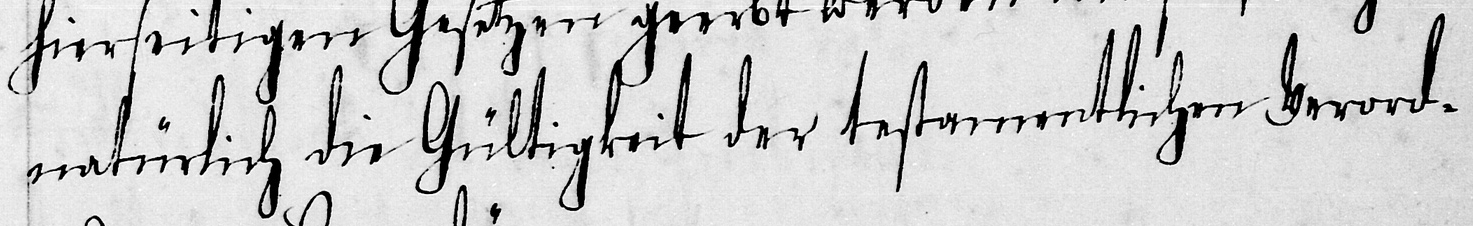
natürlich die Gültigkeit der testamentlichen Verord¬
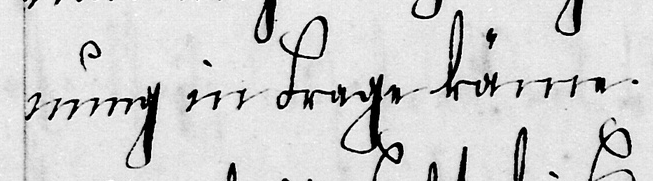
nung in Frage käme.
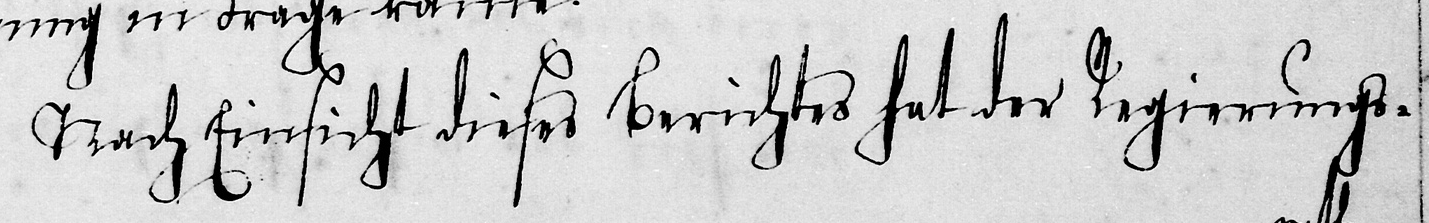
Nach Einsicht dieses Berichtes hat der Regierungs-
